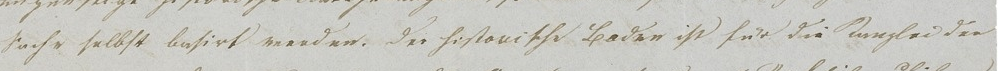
Sache selbst basirt werden. Der historische Boden ist für die Kanzlei der
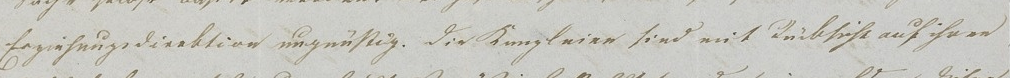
Erziehungsdirektion ungünstig. Die Kanzleinen sind mit Rücksicht auf ihren
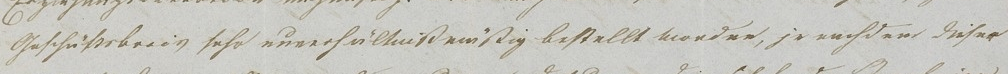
Geschäftskreis sehr unverhältnißmäßig bestellt worden, je nachdem dieser
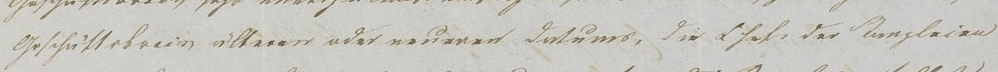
Geschäftskreis älteren oder neueren Datums, die Chefs der Kanzleien
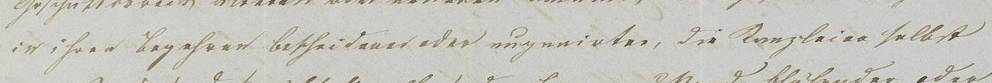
in ihren Begehren bescheidener oder ungenirter, die Kanzleien selbst
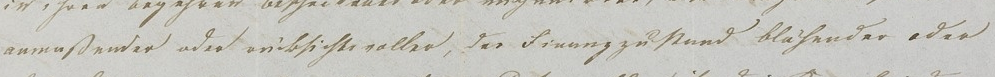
anmaßender oder rücksichtsvoller, der Finanzzustand blühender oder
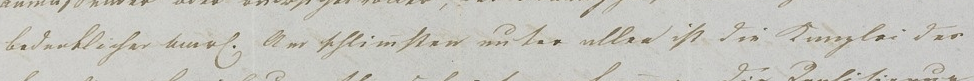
bedenklicher war. Am schlimmsten unter allen ist die Kanzlei des
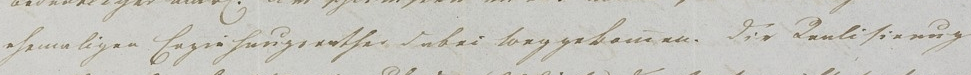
ehemaligen Erziehungsrathes dabei weggekommen. Die Realisirung
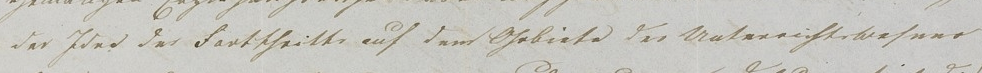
der Idee des Fortschritts auf dem Gebiete des Unterrichtswesens
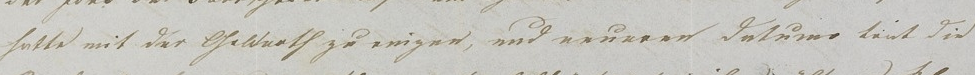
hatte mit der Geldnoth zu ringen, und neueren Datums trat die
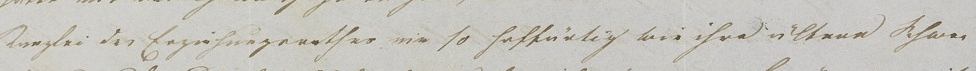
Kanzlei des Erziehungsrathes nie so hoffärtig wie ihre ältern Schwe-
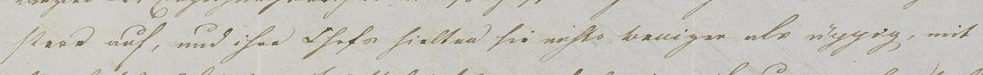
stern auf, und ihre Chefs hielten sie nichts weniger als üppig, mit
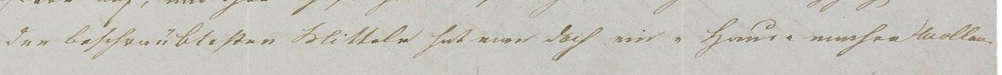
den beschränktesten Mitteln hat man doch ein «Haus» machen wollen
